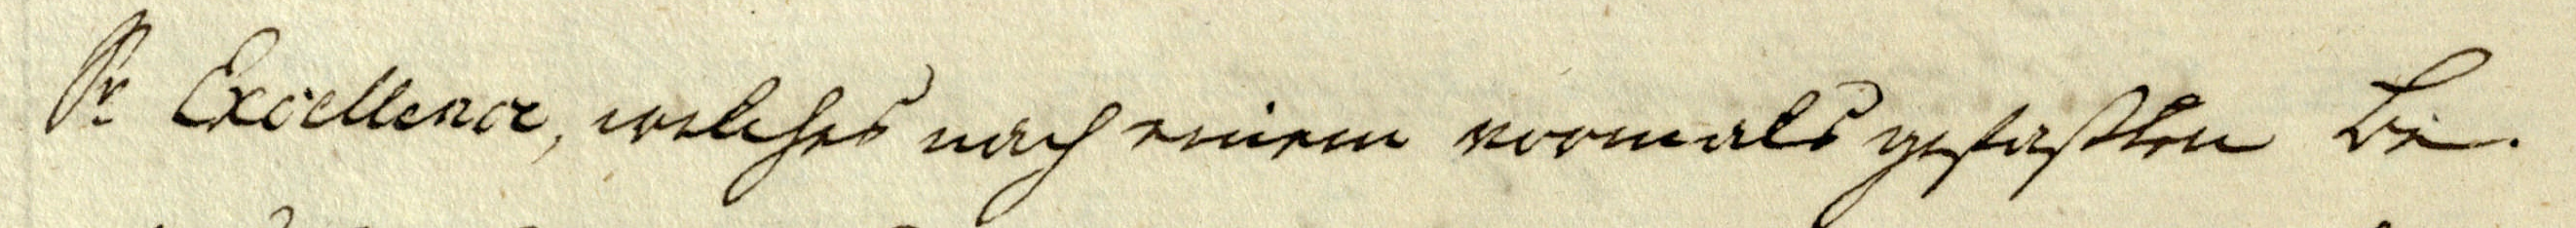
Sr. Excellence, welches nach einem vormals gefaßten Be¬
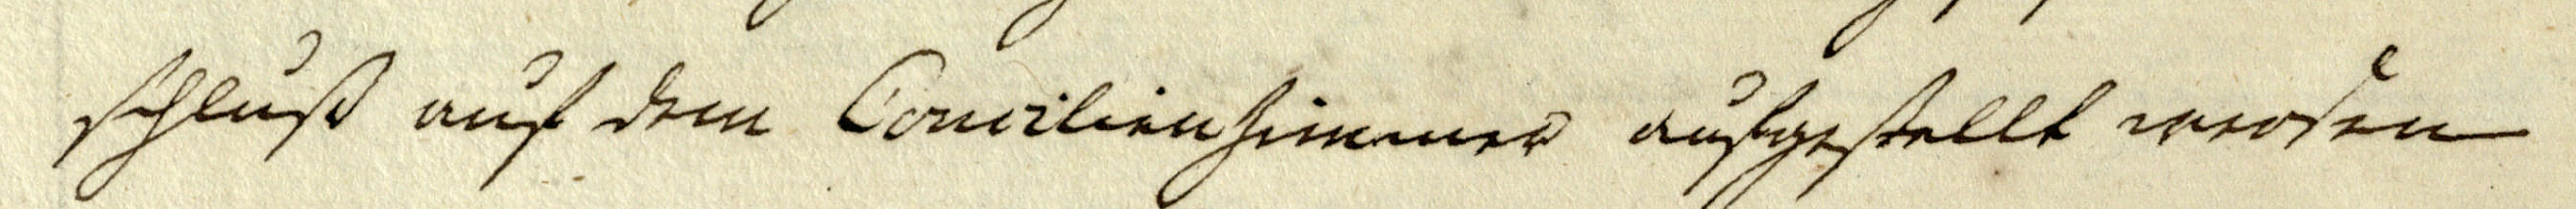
schluß auf dem Concilienzimmer aufgestellet werden
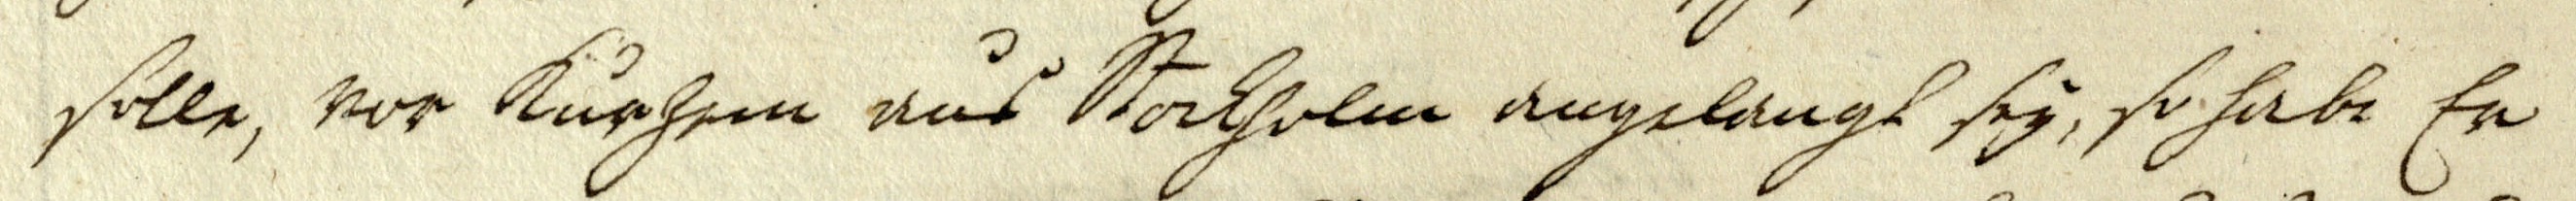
solle, vor Kurzem aus Stockholm angelangt seÿ, so habe Er
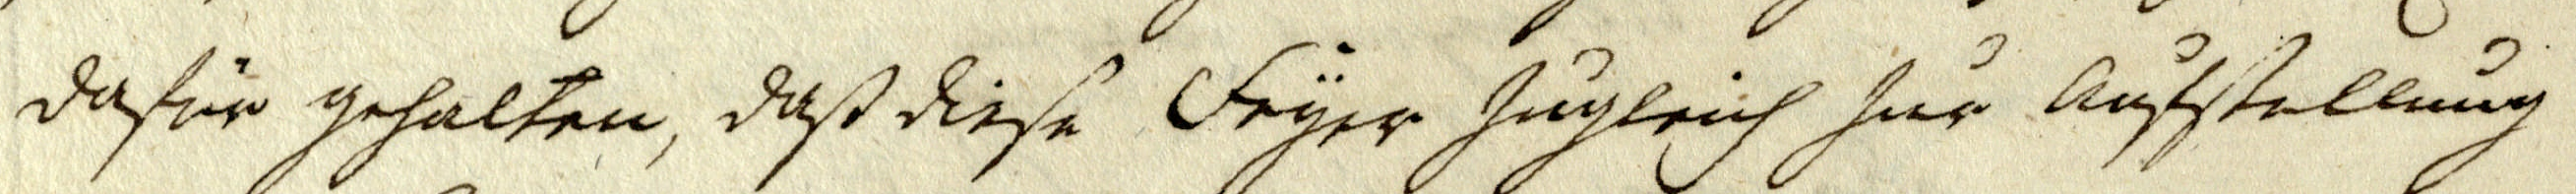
dafür gehalten, daß diese Feÿer zugleich zur Aufstellung
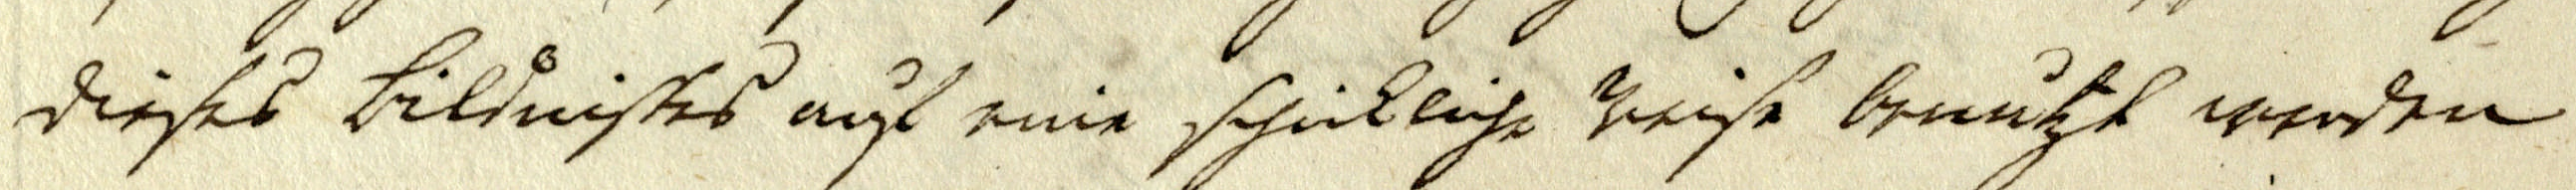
diese Bildnisses auf eine schickliche Weise benutzt werden
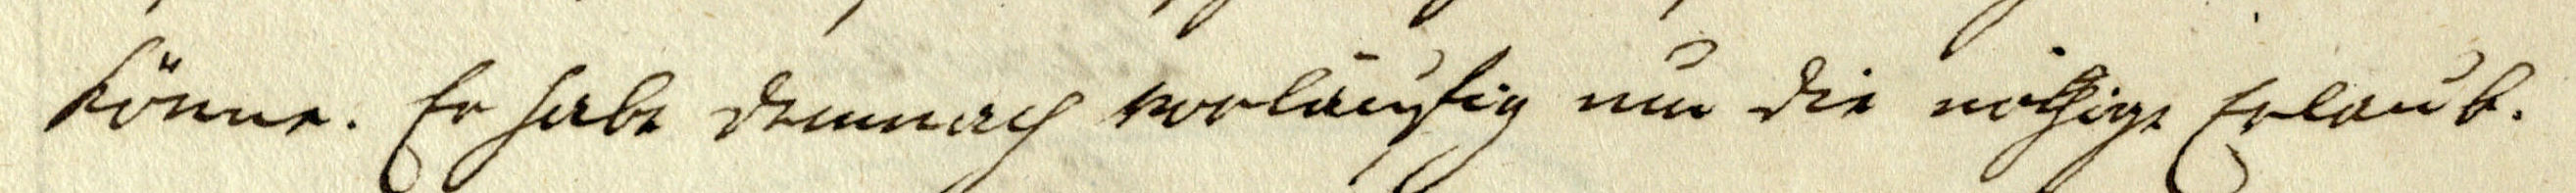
könne. Er habe demnach vorläufig um die nöthige Erlaub¬
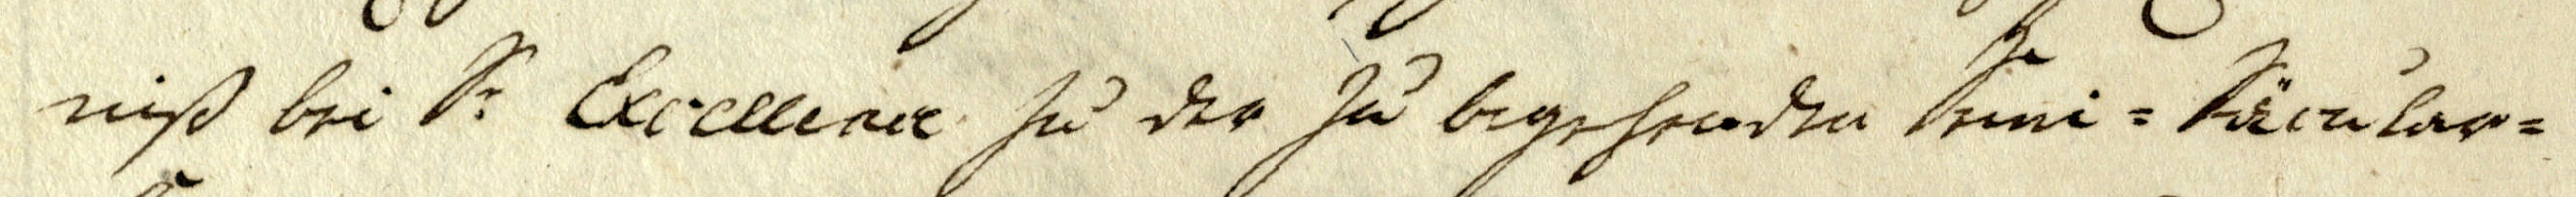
nis bei Sr. Excellence zu der zu begehenden Semi-Säcular¬
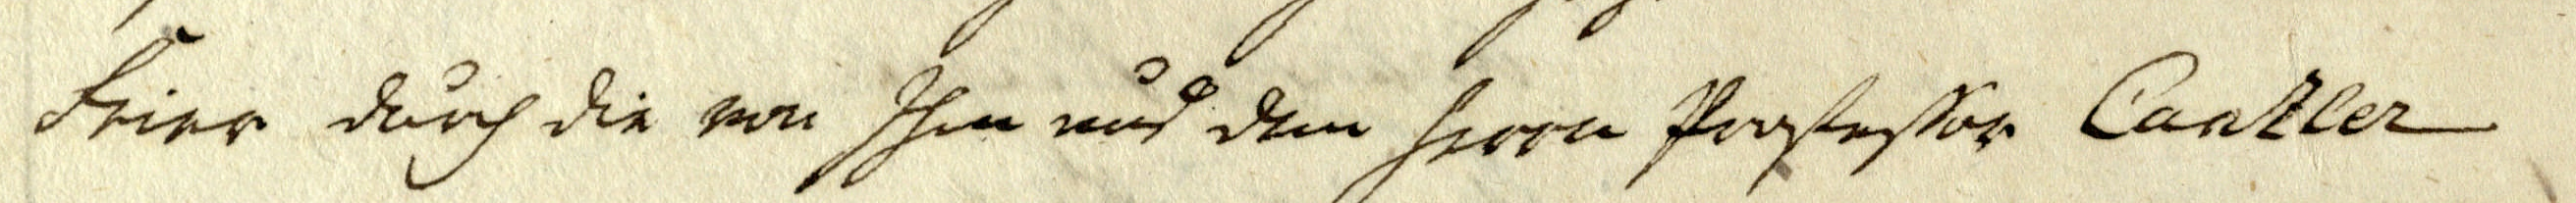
Feier durch die von Ihm und dem herrn Professor Canzler
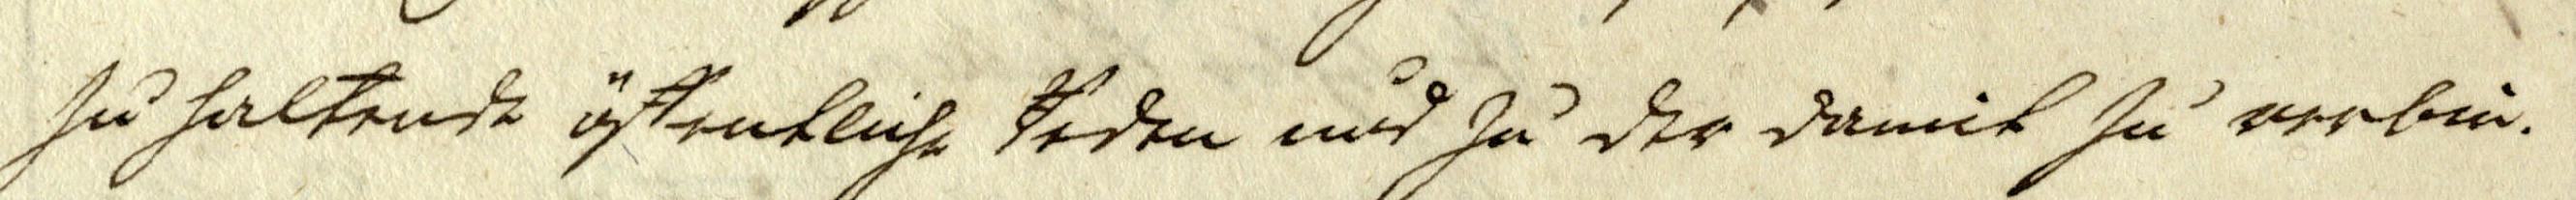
zu haltende öffentliche Reden und zu der damit zu verbin¬
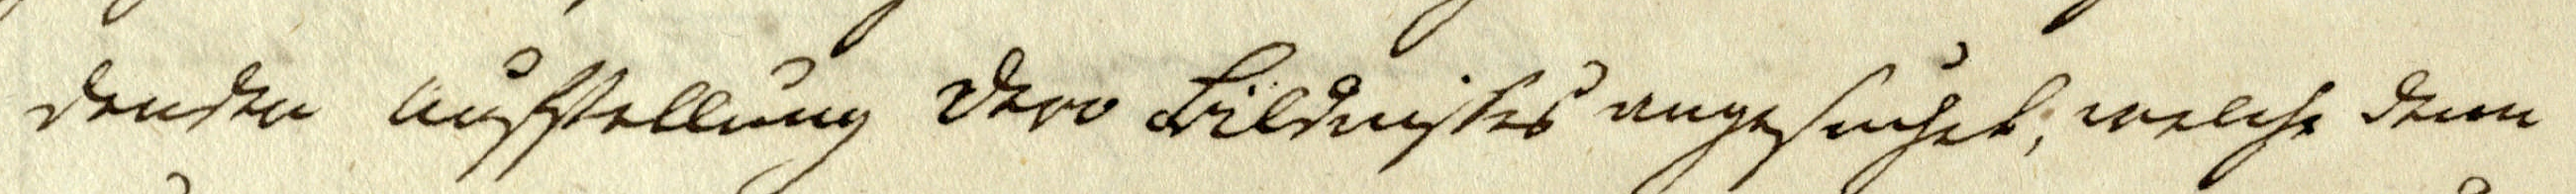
denden Aufstellung dero Bildnisses angesuchet, welche denn
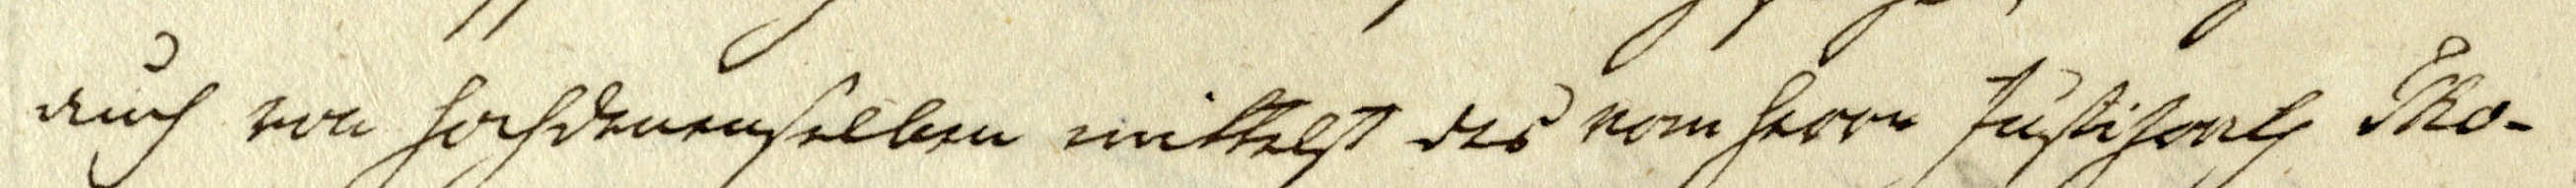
auch von hochdenenselben mittelst des vom herrn Justizrath Tho¬
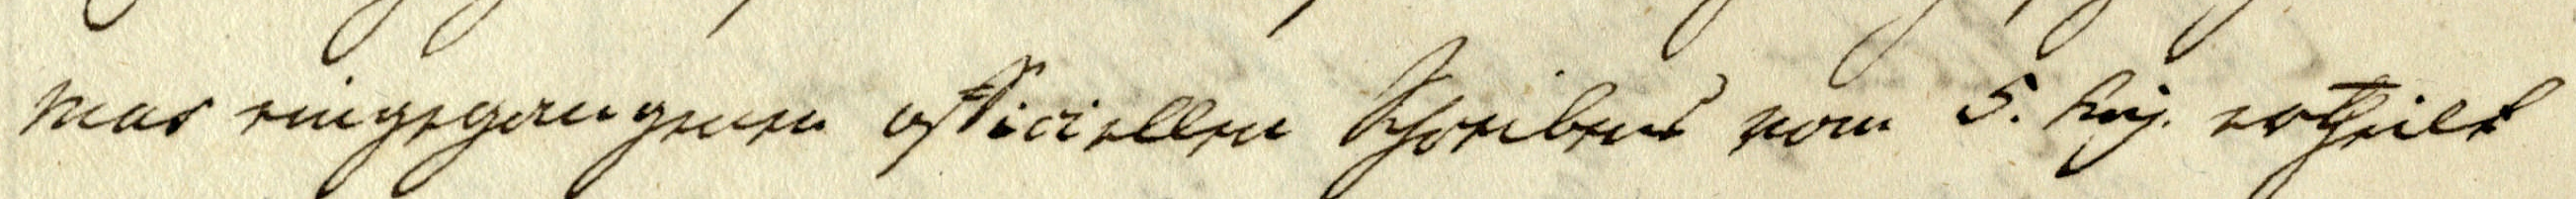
mas eingegangenen officiellen Schreibens vom 5. huj. ertheilt
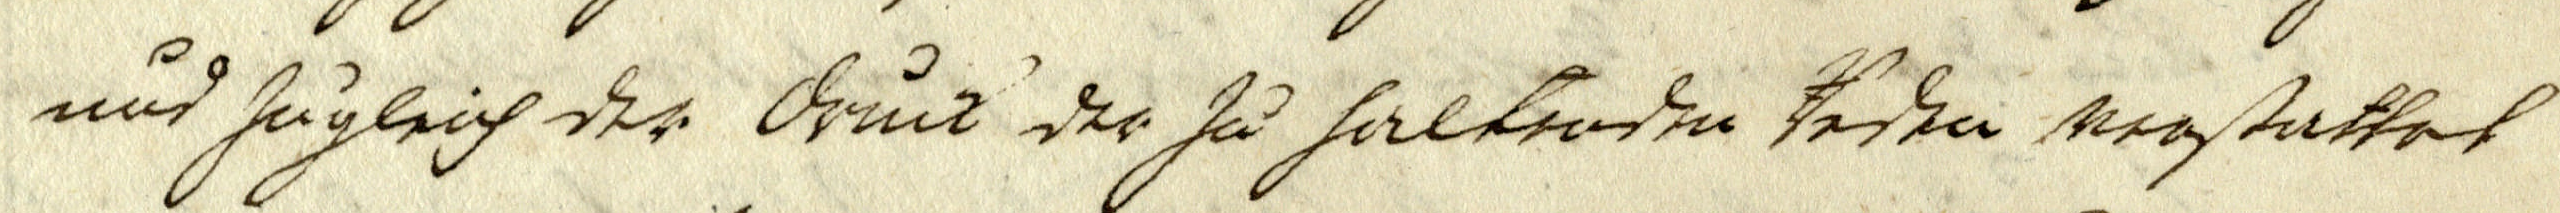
und zugleich der Druck der zu haltenden Reden verstattet
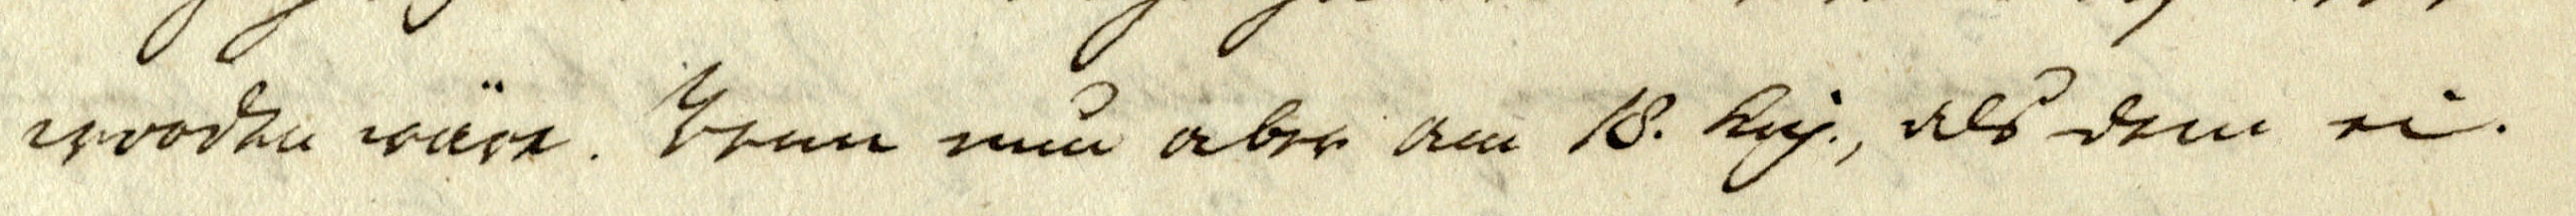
worden wäre. Wenn nun aber am 18. huj., als dem ei¬
